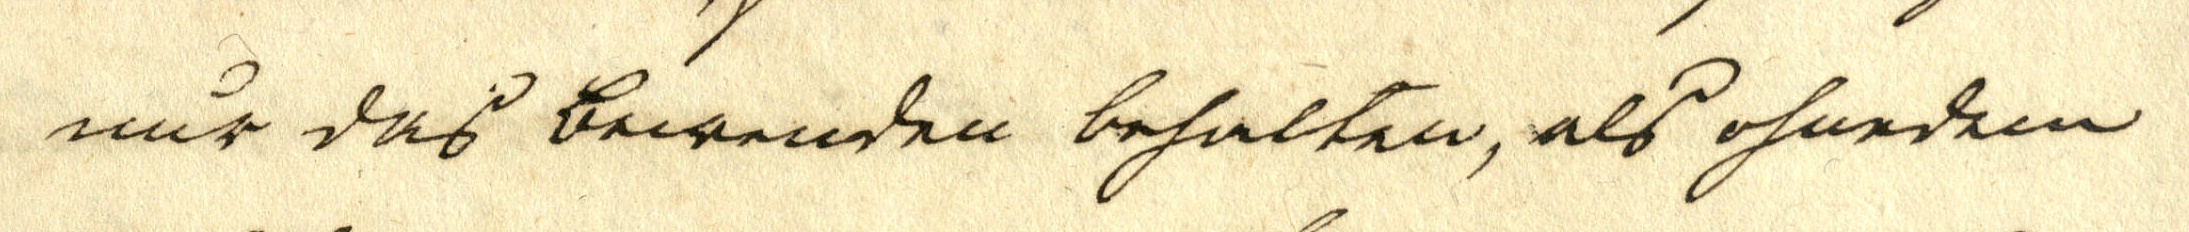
nur das Bewenden behalten, als ohnedem
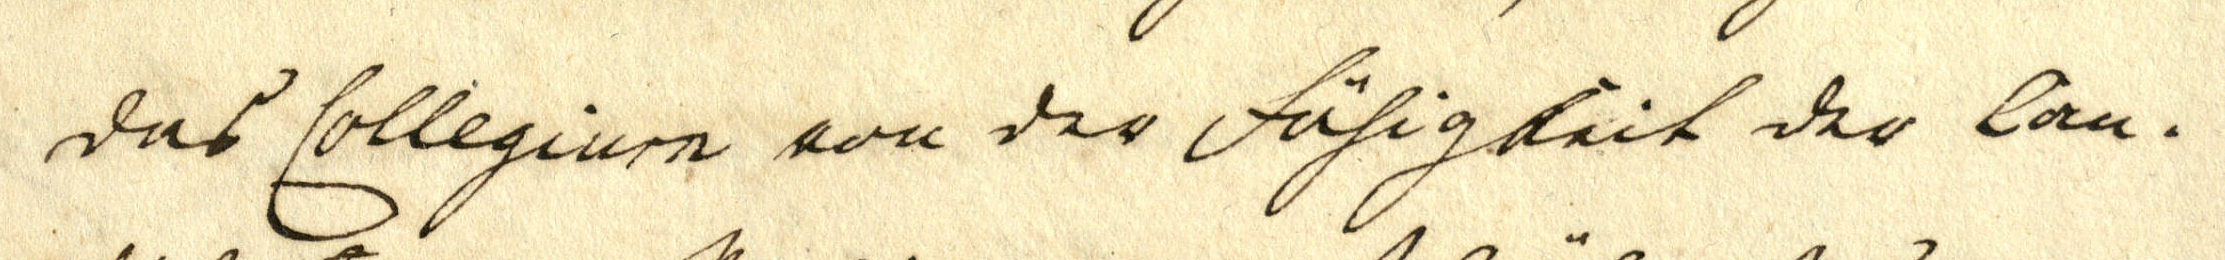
das Collegium von der Fähigkeit der Can¬
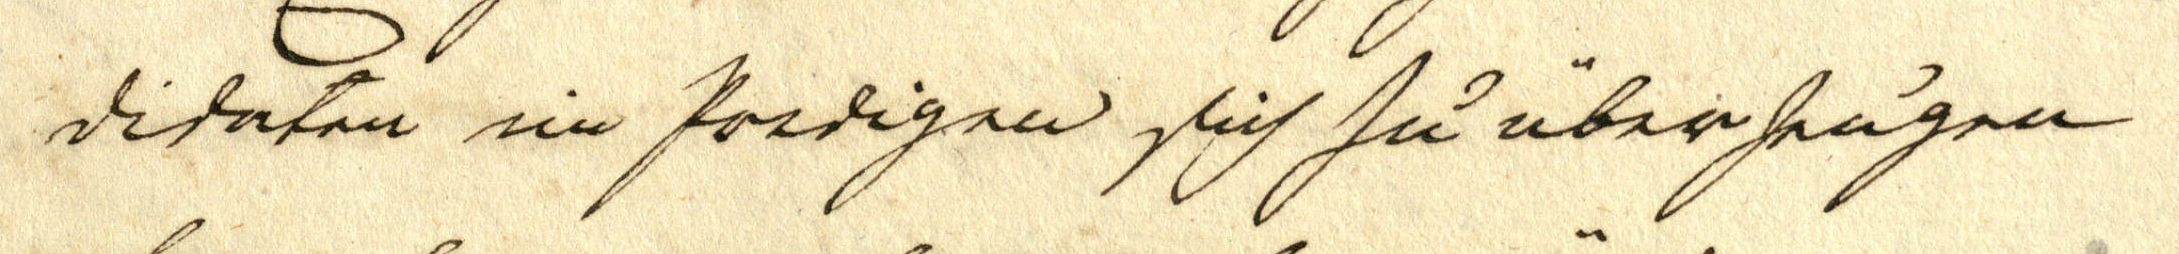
didaten im Predigen sich zu überzeugen
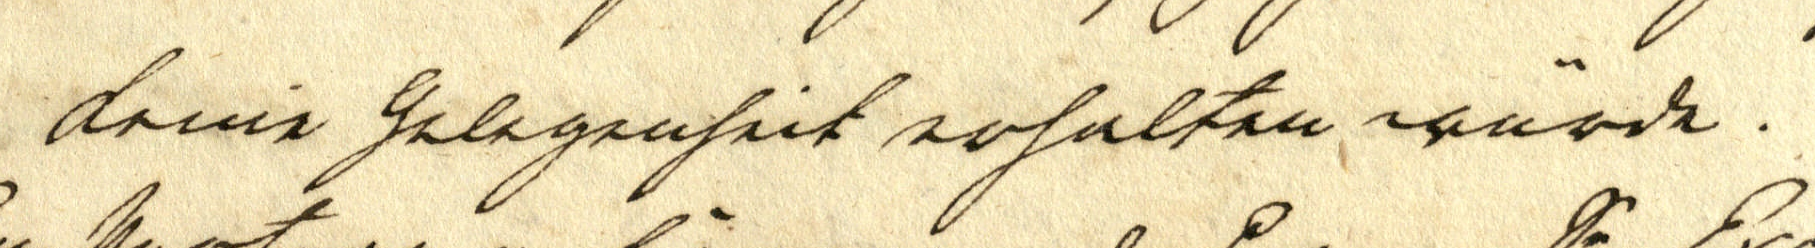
keine Gelegenheit erhalten würde.
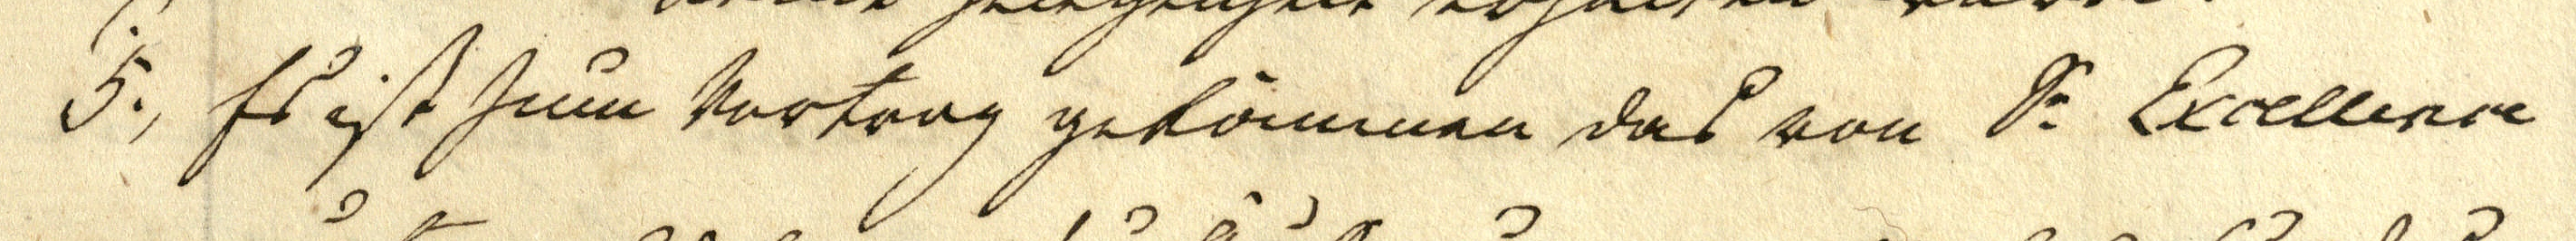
5., Es ist zum Vortrag gekommen das von Sr Excellence
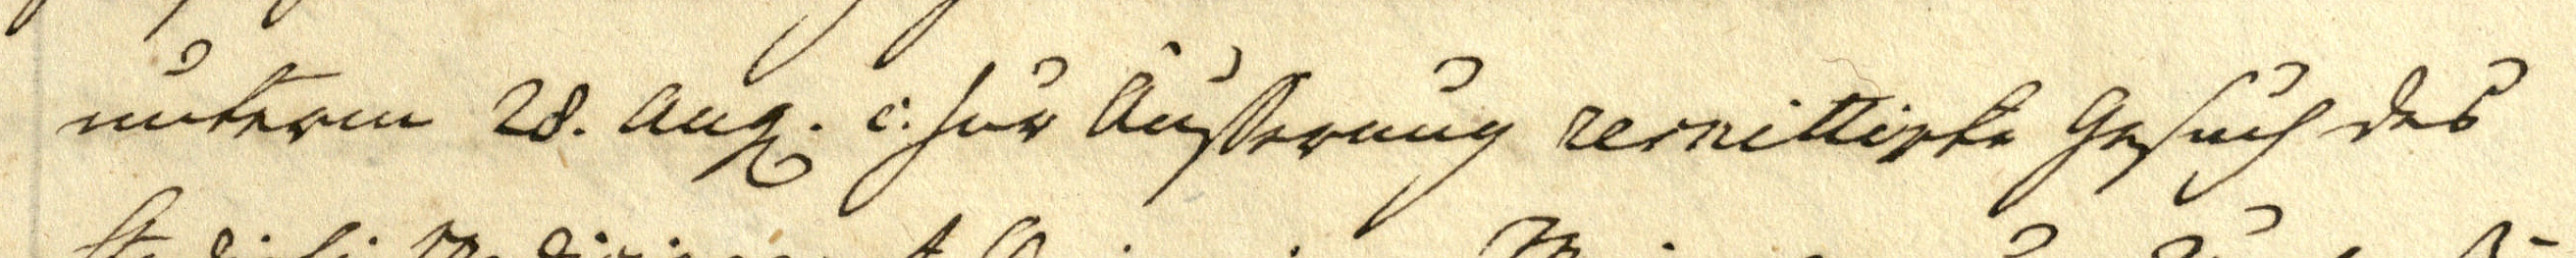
unterm 28. Aug. c. zur Äusserung remittirte Gesuch des
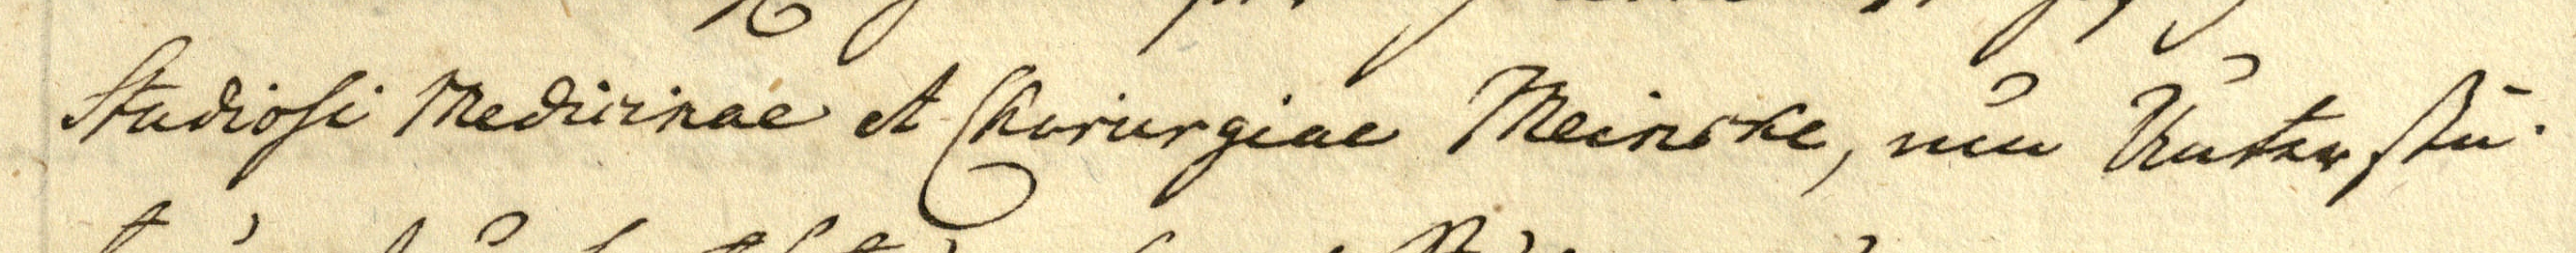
Studiosi Medicinae et Chirurgiae Meincke, um Unterstü¬
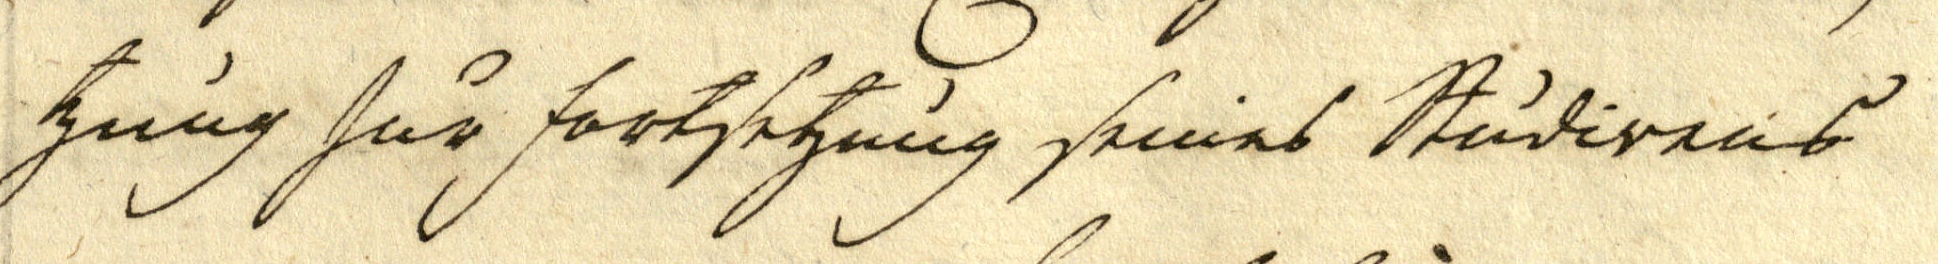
tzung zur Fortsetzung seines Studirens.
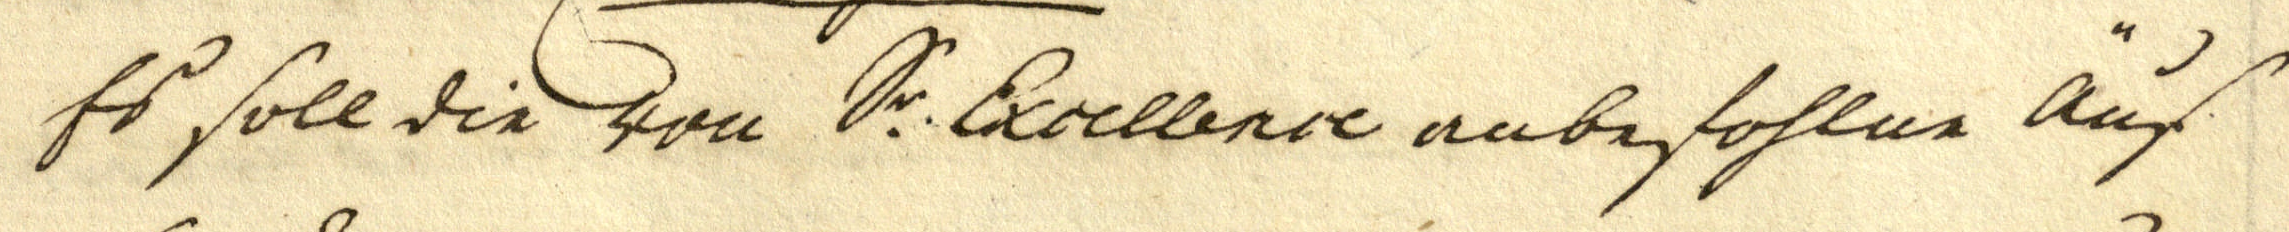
Es soll die von Sr. Excellence anbefohlne Äus¬
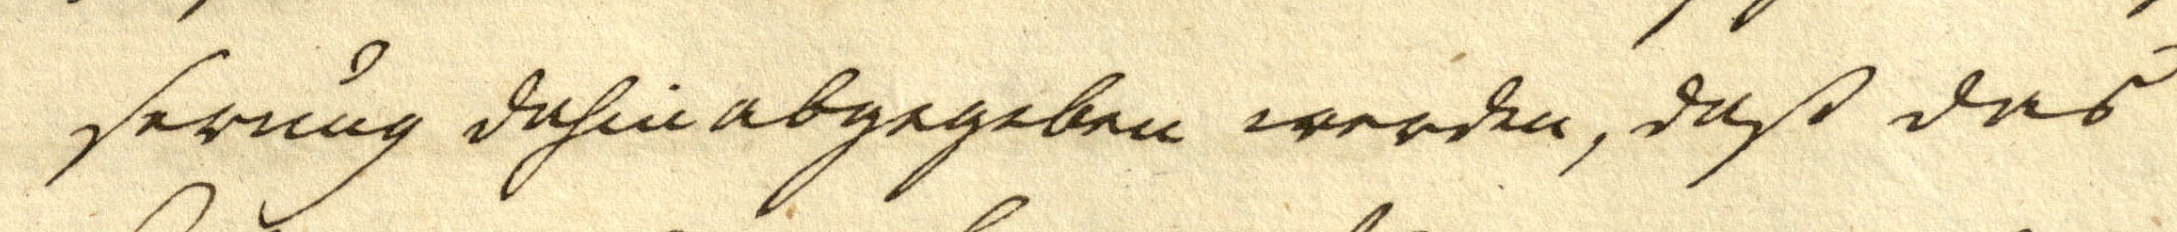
serung dahin abgegeben werden, daß das
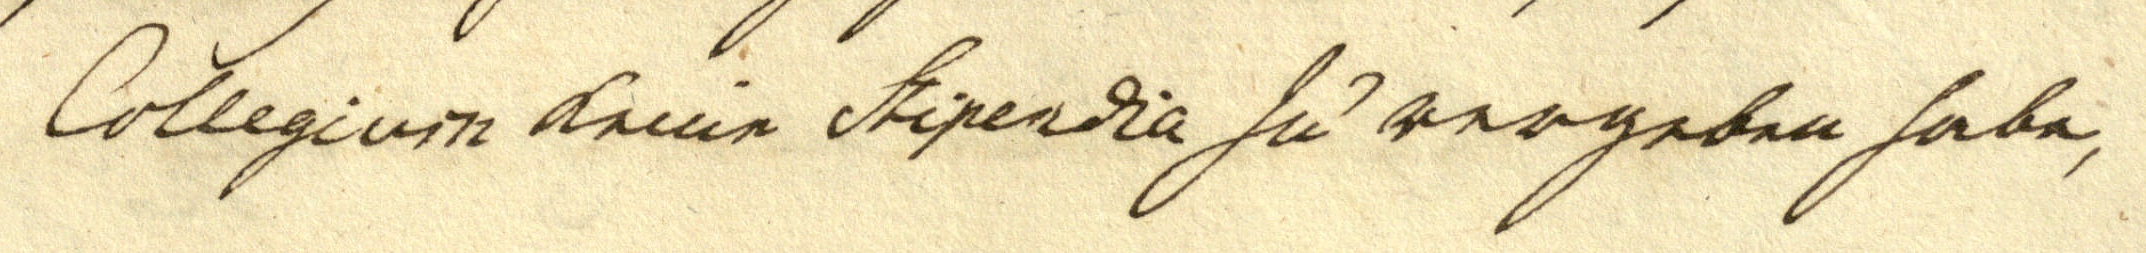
Collegium keine Stipendia zu vergeben habe,
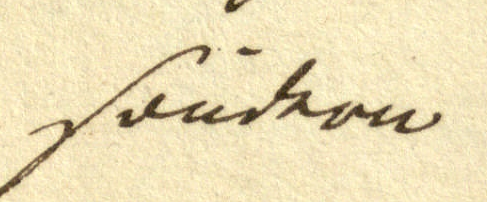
sondern
